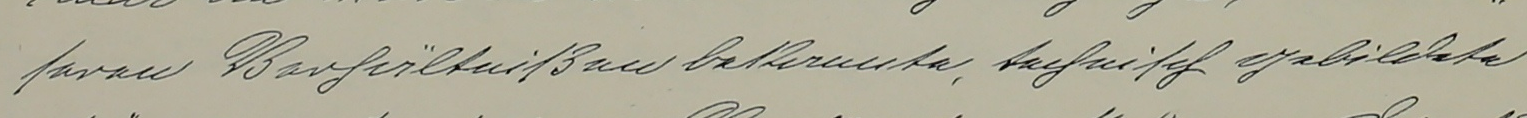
seren Verhältnißen bekannte, technisch gebildete
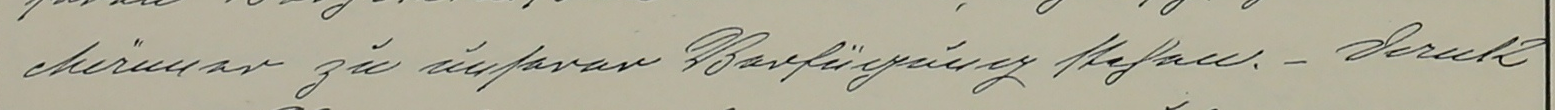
Männer zu unserer Verfügung stehen. - Dank
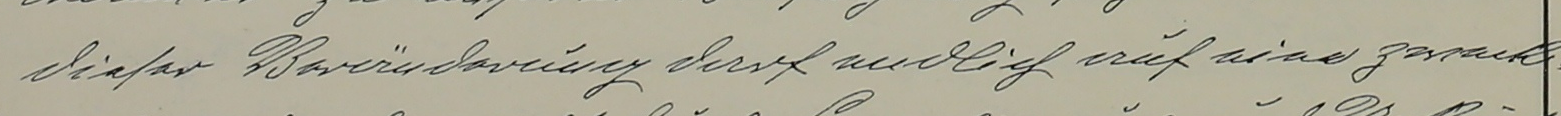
dieser Veränderung darf endlich auf eine zweck-
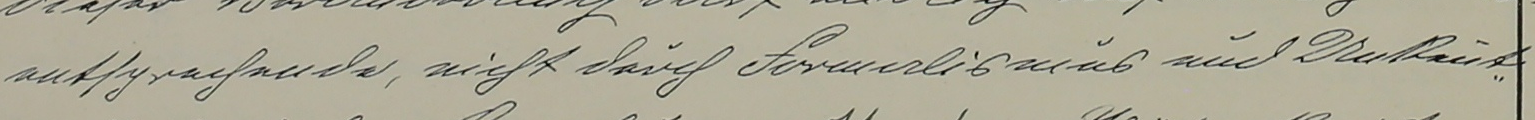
entsprechende, nicht durch Formalismus und Unkennt-
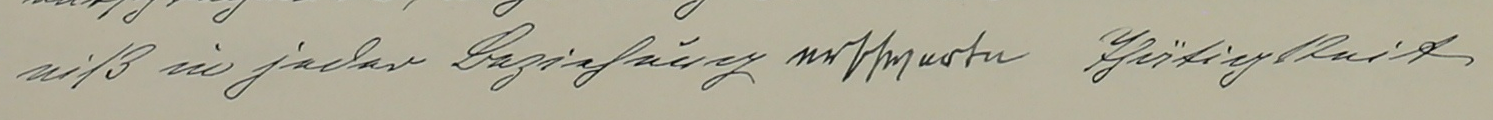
niß in jeder Beziehung erschwerte Thätigkeit
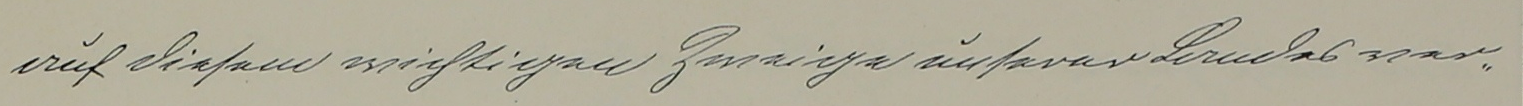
auf diesem wichtigen Zweige unserer Landesver-
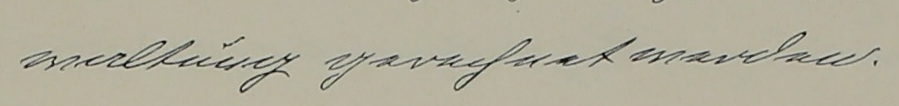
waltung gerechnet werden.
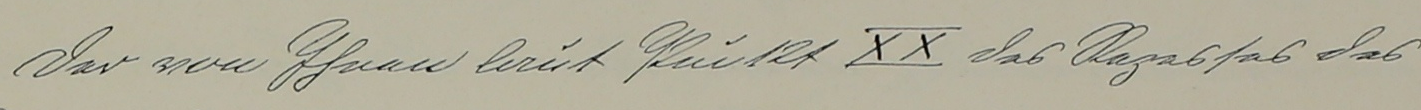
Der von Ihnen laut Punkt XX des Rezesses des
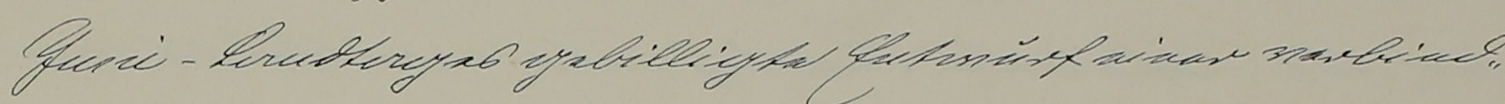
Juni-Landtages gebilligte Entwurf einer verbind-
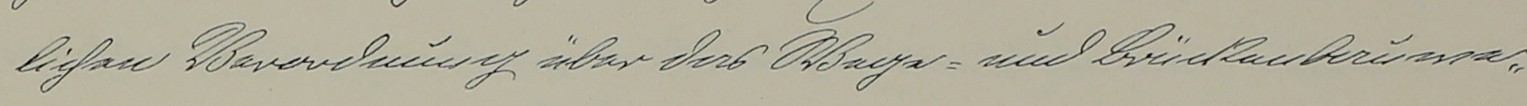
lichen Verordnung über das Wege- und Brückenbauwe-
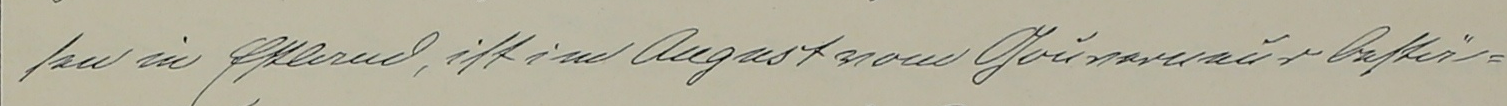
sen in Estland, ist im August vom Gouverneur bestä-
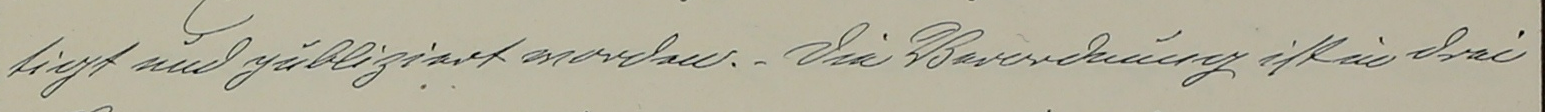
tigt und publiziert worden. - Die Verordnung ist in drei
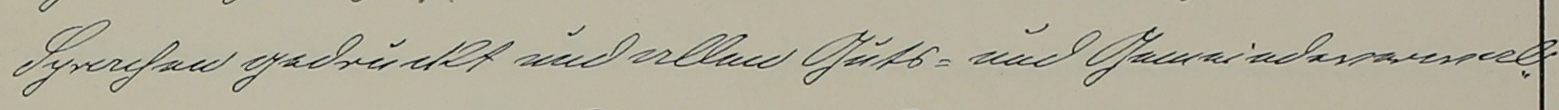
Sprachen gedruckt und allen Guts- und Gemeindeverwal-
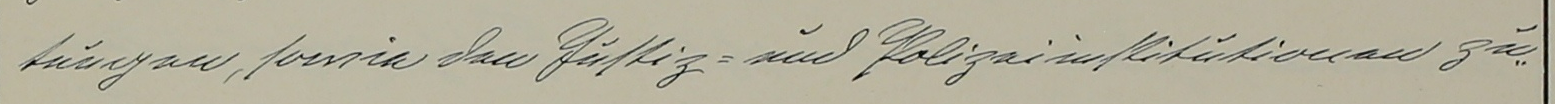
tungen sowie den Justiz- und Polizeiinstitutionen zu-
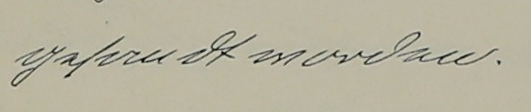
gesandt worden.
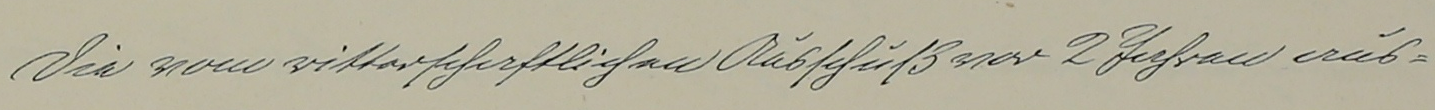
Die vom ritterschaftlichen Ausschuß vor 2 Jahren aus-
